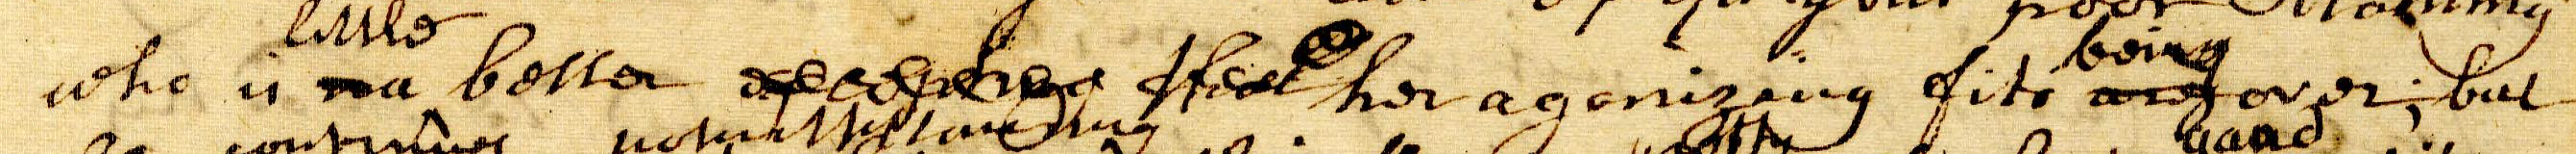who is a ^ better [______] [that] her agonizing fits [___] over; but
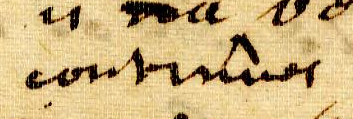continues
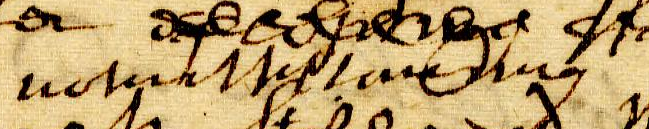notwithstanding
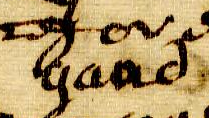good
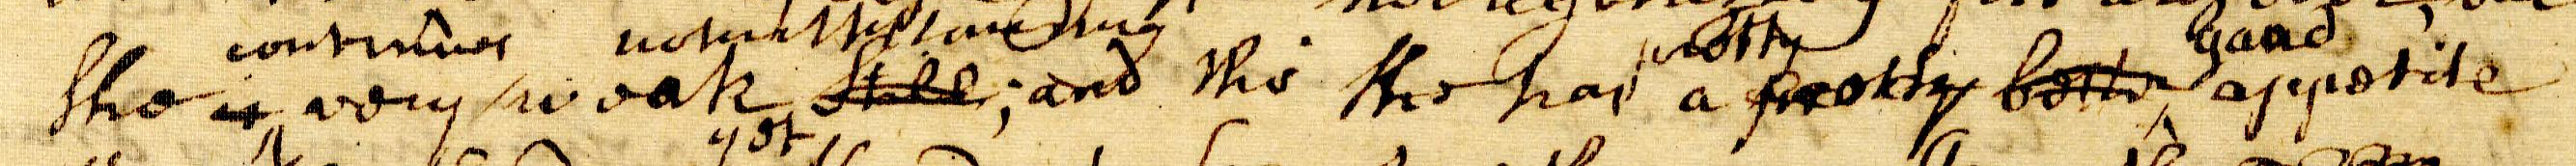she is ^ very weak [Still]; and tho she has a pretty [better] ^ appetite
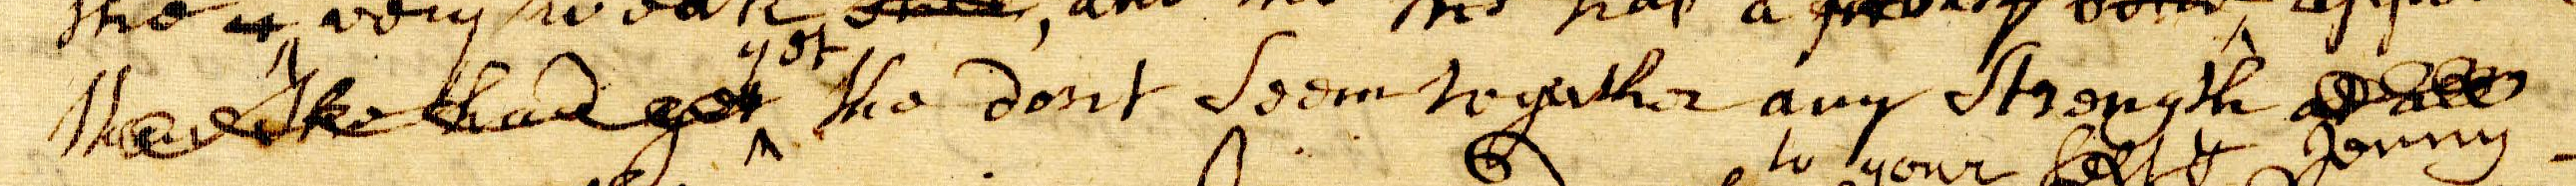[than she had got] ^ she dont Seem to gather any Strength [at all]
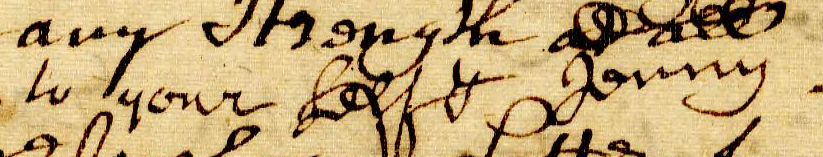to your Self & Jenny
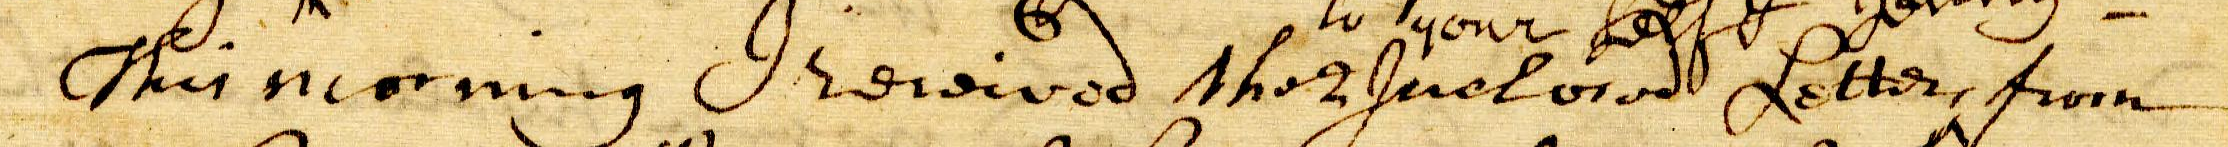This incoming I received the 2 Inclosed Letters from
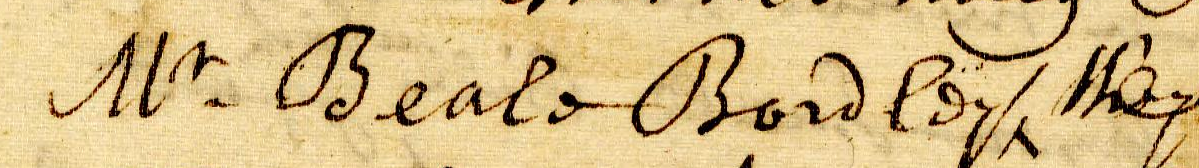M^r. Beale Bard Esq ^ they
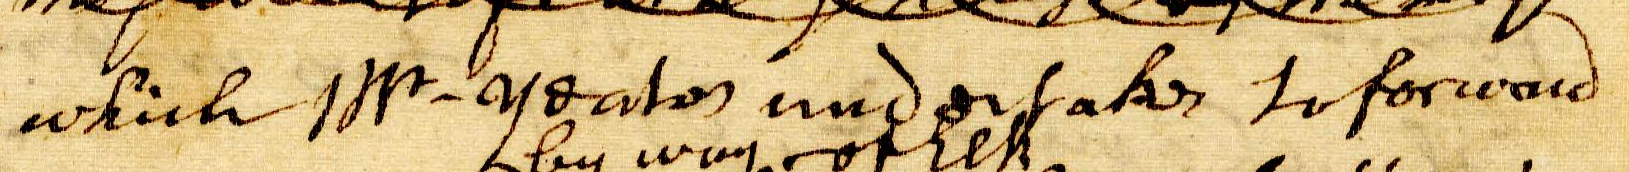which M^r- Yeates undertakes to forward
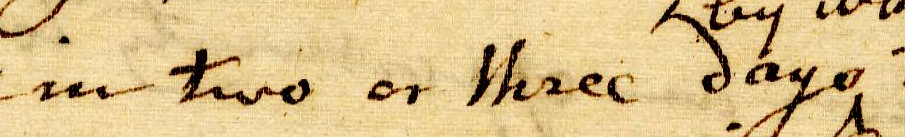in two or three days ^
